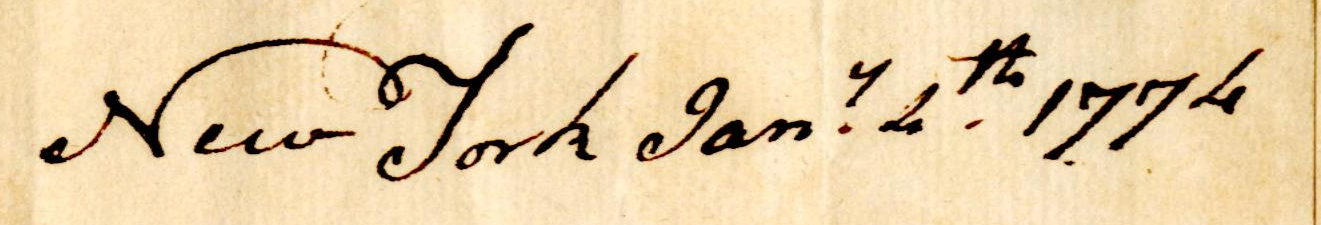New York Jan^y. 4^th 1774
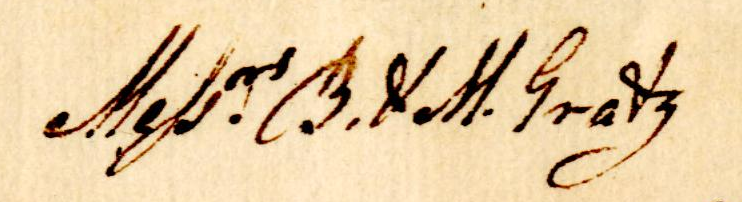Mess^rs. B. & M. Gratz
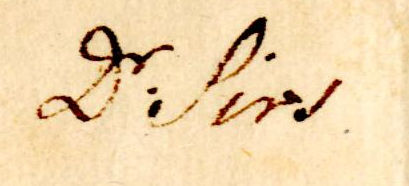D^r: Sirs
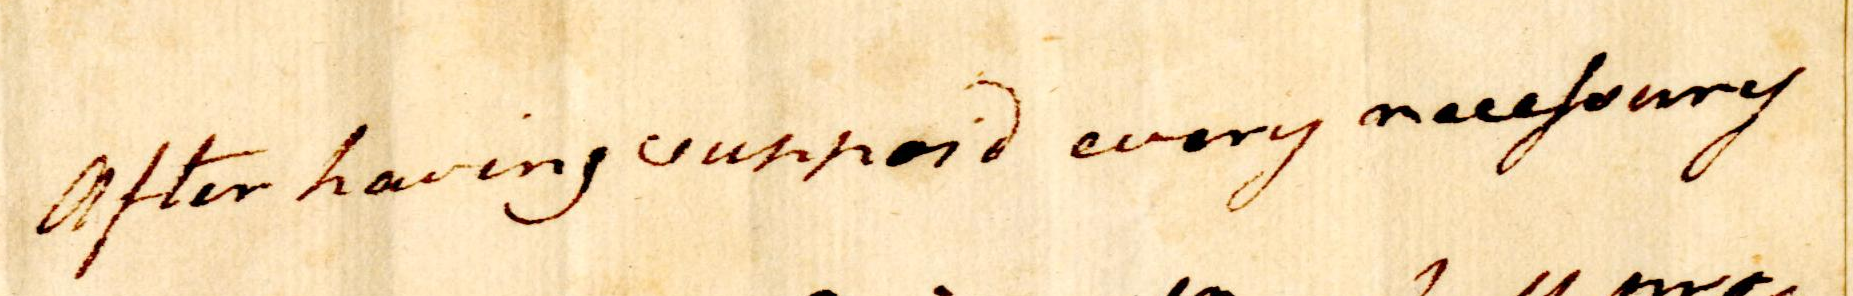After having suppos'd every necessary
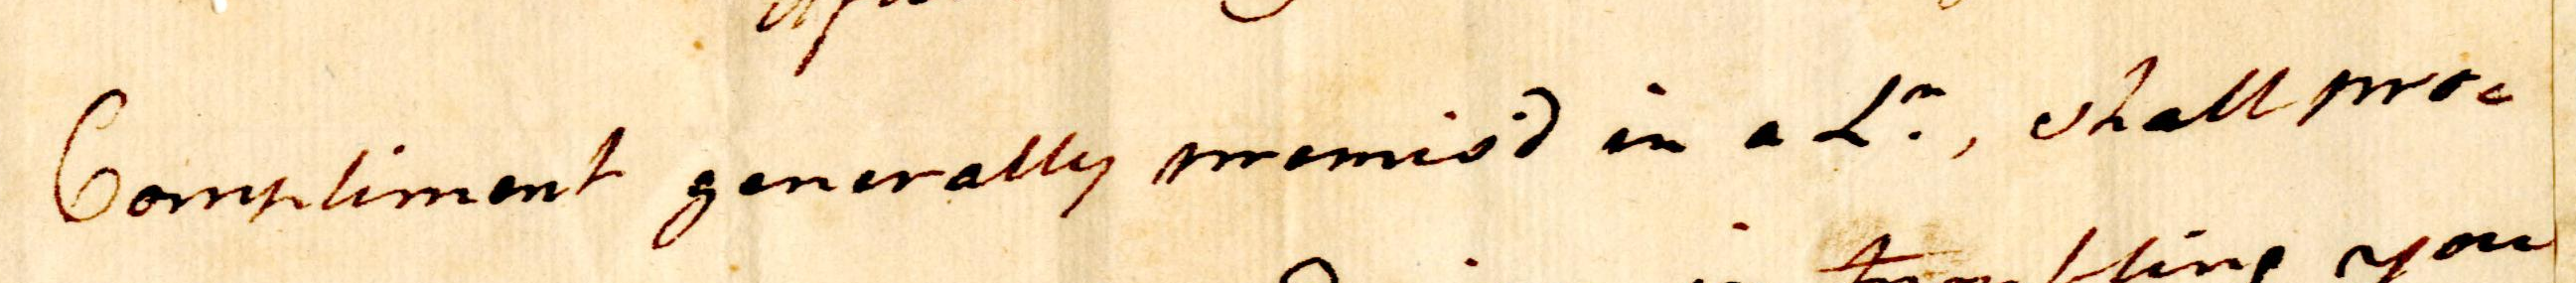Compliment generally promis'd in a L^r., shall proc-
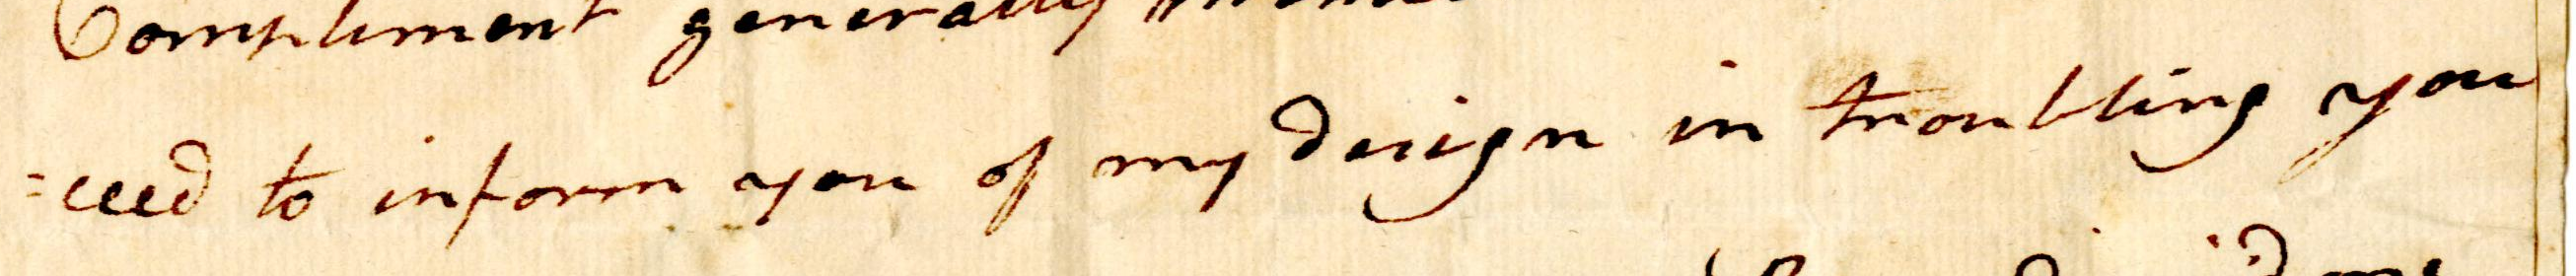-ceed to inform you of my design in troubling you
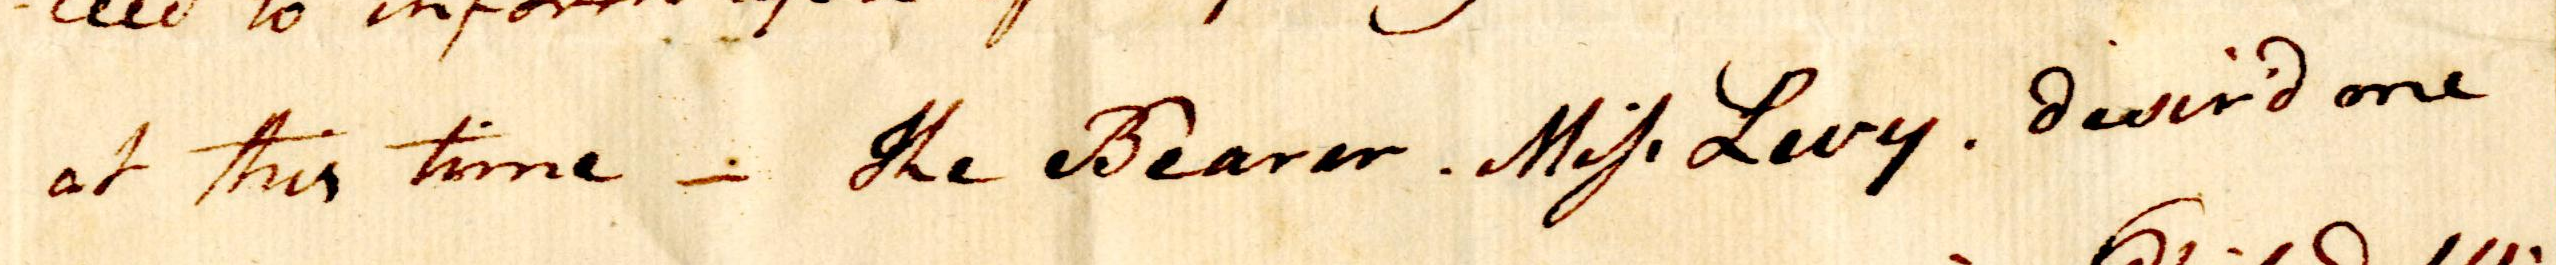at this time- The Bearer. Miss Levy. desir'd one
